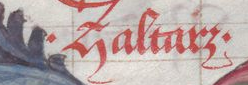.Zaltarz.
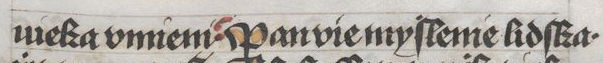uieka vmieni?Pan vie myẛlenie lidſka.
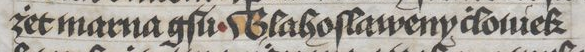żet marna gſu.Blahoſlaweny ċlouiek
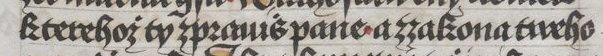kterehoż ty zprauiṡ pane.a zzakona tweho
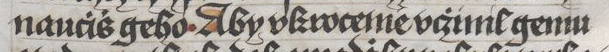nauċiṡ geho.Aby vkrocenie vcżinil gemu
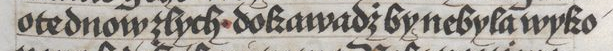ote dnow zlych.dokawadż by nebyla wyko¬
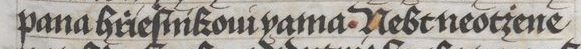pana hṙíeẛníkoui yama.Nebt neotżene
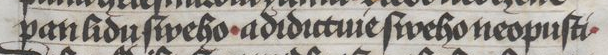pan lidu ſweho.a didictuie ſweho neopuſti.
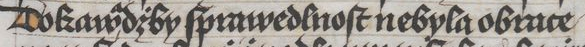Dokawadż by ſprawedlnoſt nebyla obrace¬
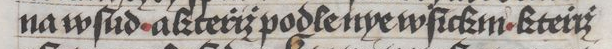na w ſud.a kteṙíż podle nye wẛickni.kteṙiż
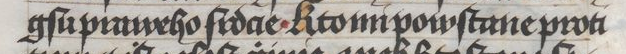gſu praweho ſrdcie.Kto mi powſtane proti
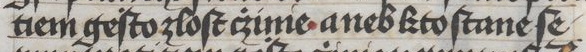tiem geẛto zloſt cżinie.aneb kto ſtane ſe¬
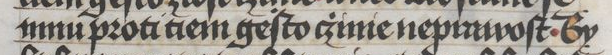mnu proti tiem geẛto cżinie neprawoſt.By
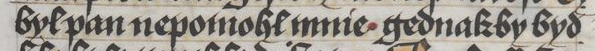byl pan nepomohl mnie.gednak by byd¬
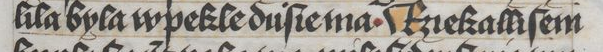lila byla w pekle duẛie ma.Rziekalliſem
